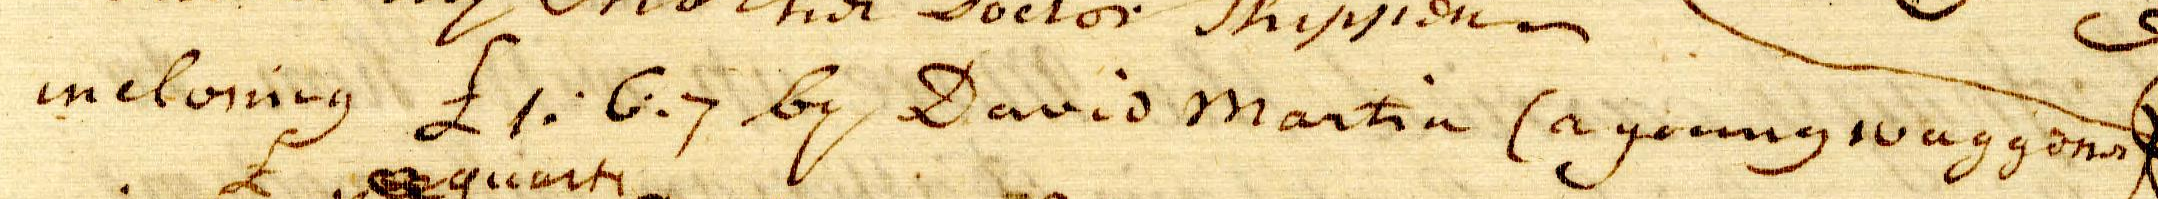inclosing £1..6.7 by David Martin (a young waggons)
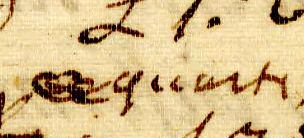quarts
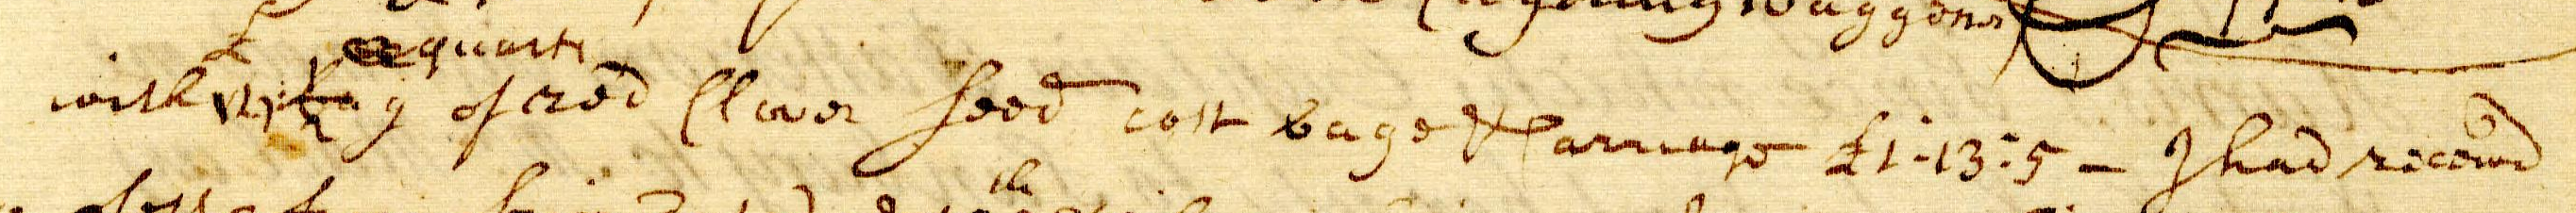with [____] of red Clover feed cost bags & Carriage £1.13..5- I had received
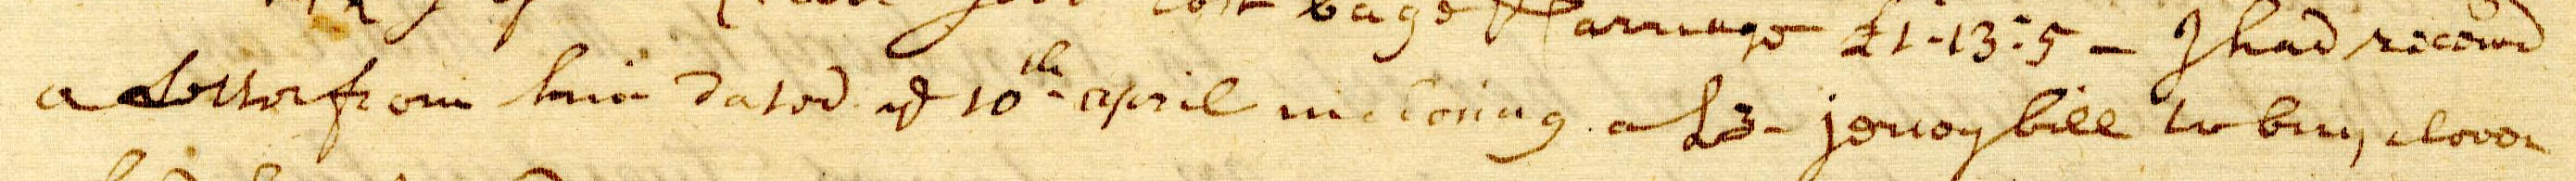a Letter from him dated y^e 10^th. april inclosing a £3 jersey bill to buy clover
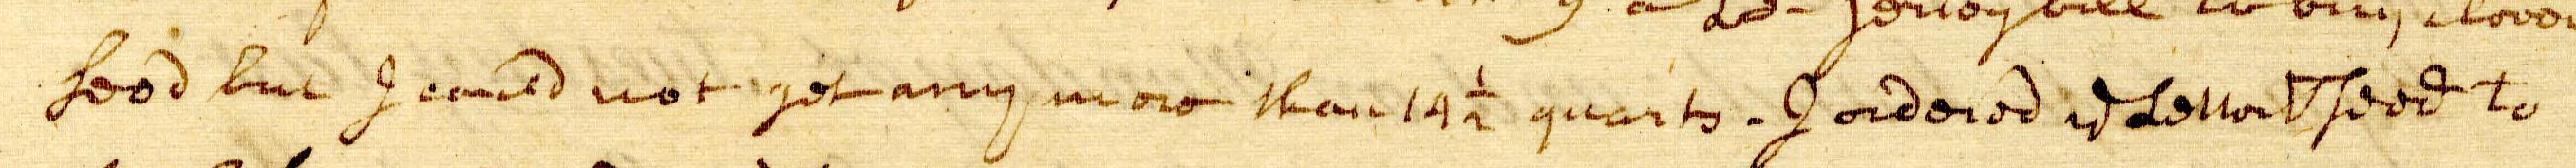food but I could not get any more than 14 1/2 quarts - I ordered y^e Letter & food to
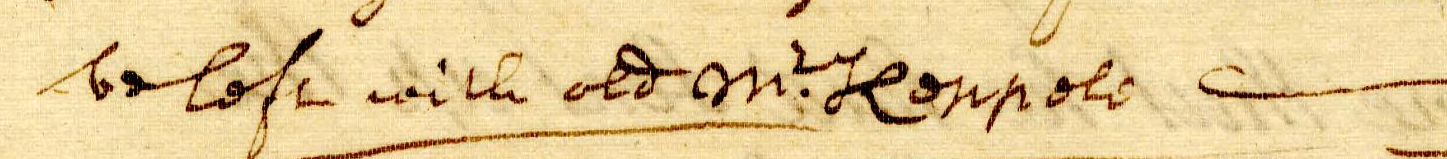be left with old M^r. Keppele
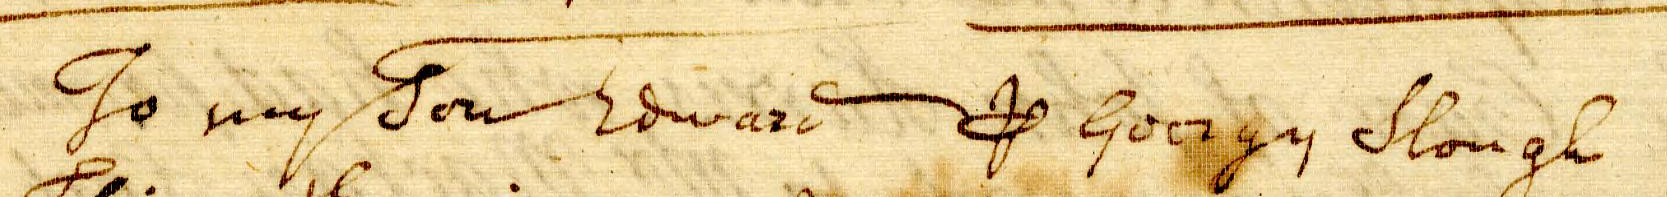To my Son Edward per Georgy Slough
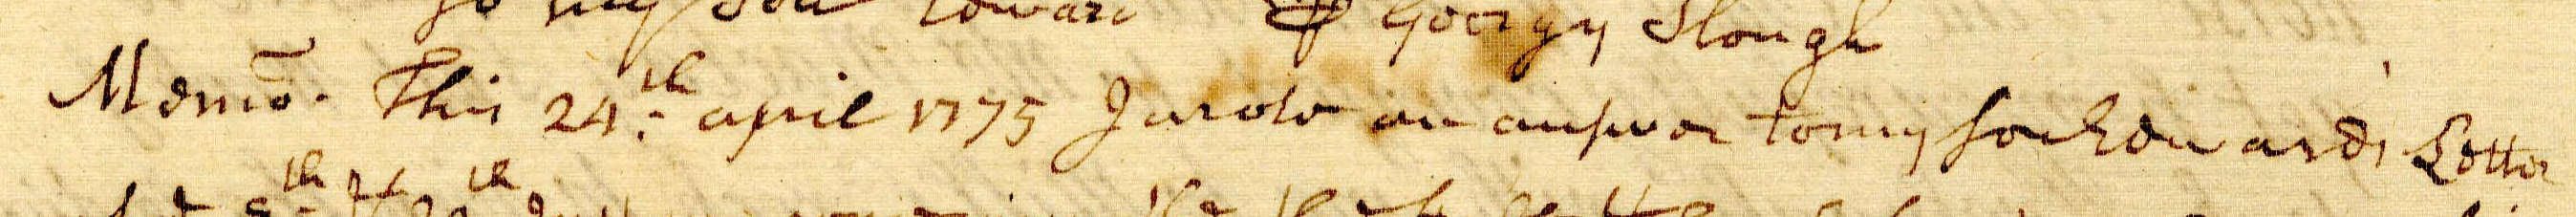Morn^g. This 24^th. april 1775 I wrote an answer to my Son Edward's Letter
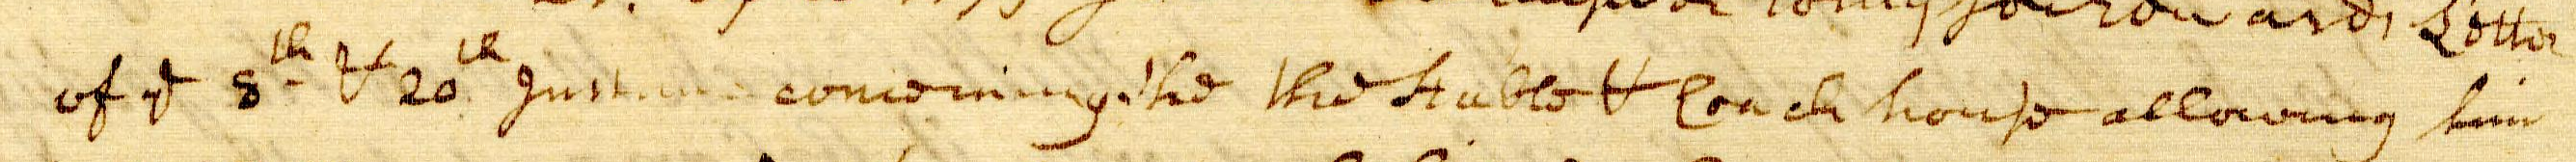of y^e 8^th- the 20^th Inst. concerning the the Stable & Coach house allowing him
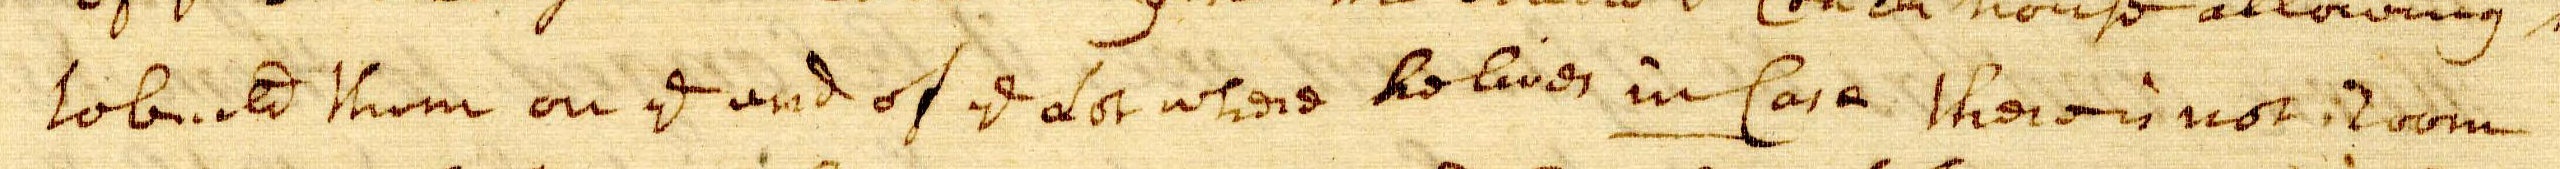to build them on y^e end of y^e Lot where he lives in Case there is not room
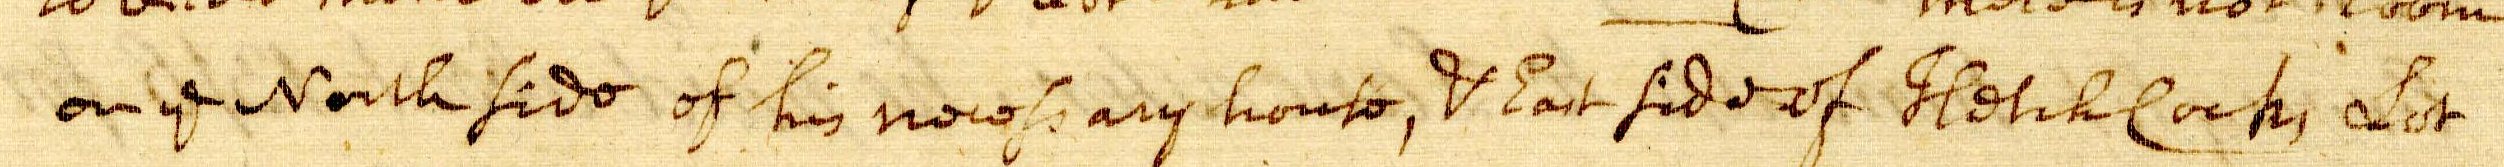on y^e North side of his necessary house, & East Side of Hetchcock's, Lot
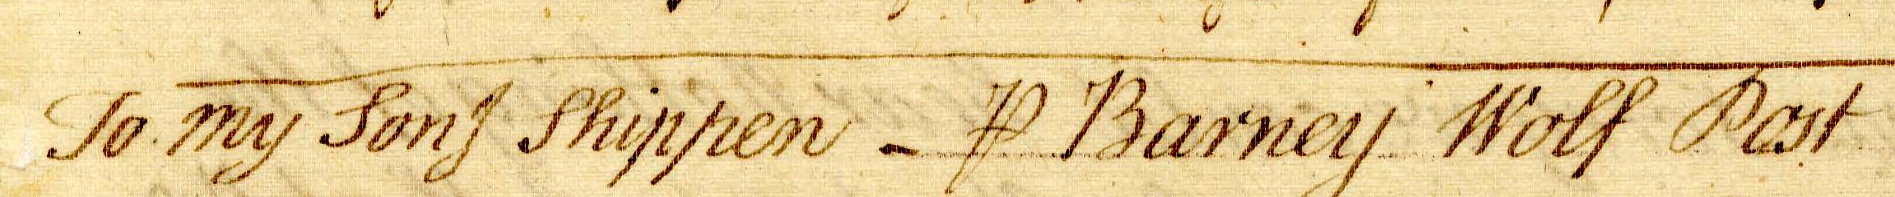To my Son J Shippen - per Barney Wolf Post
